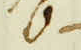6
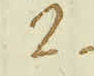2
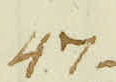47
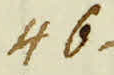46
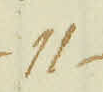11
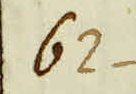62
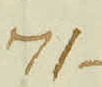71
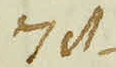78
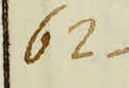62
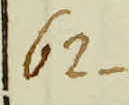62
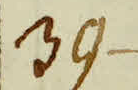39
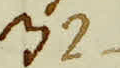32
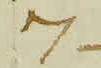7
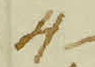4
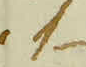1
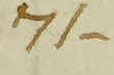11
